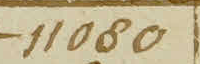11080
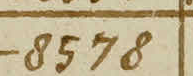8578
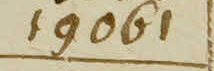19061
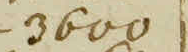3600
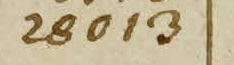28013
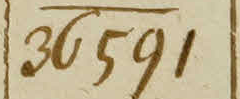36591
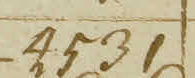4531
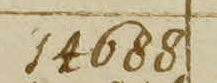14688
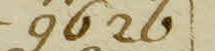9626
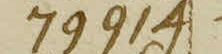79914
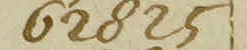62825
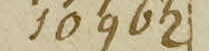10962
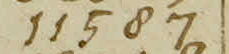11587
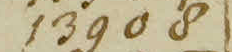13908
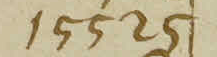15525
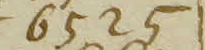6525
